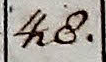48.
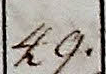49.
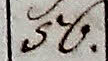56.
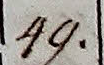49.
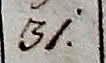31.
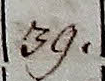39.
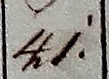41.
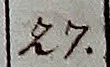27.
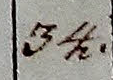34.
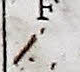1.
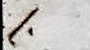1.
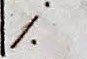1.
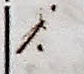1.
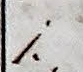1.
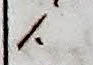1.
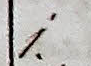1.
